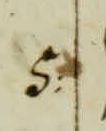5:
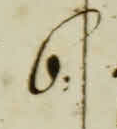6:
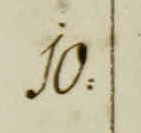10:
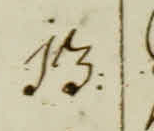13:
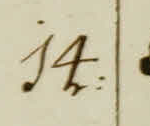14:
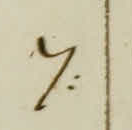7:
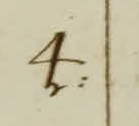4:
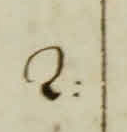2:
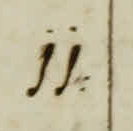11:
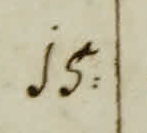15:
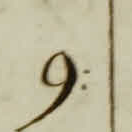9:
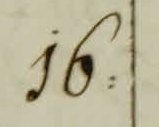16:
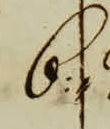6:
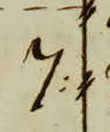7:
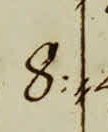8:
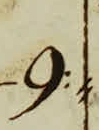9:
